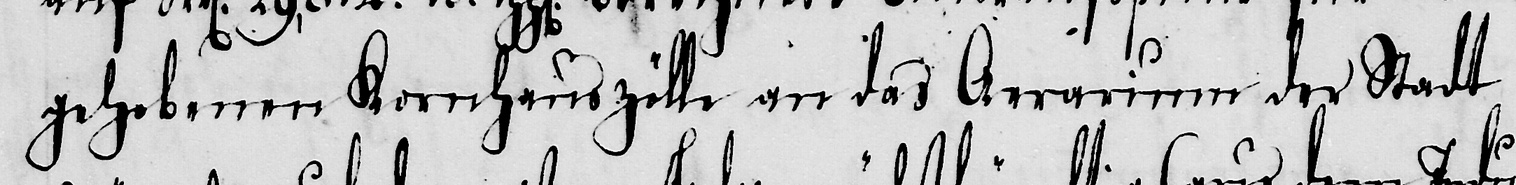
fgehobenen Kornhauszölle an das Arrarium der Stadt
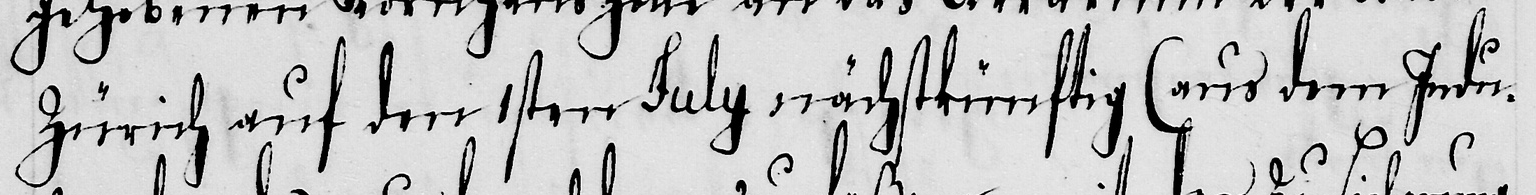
Zürich auf den 1sten July nächstkünftig (aus dem Indu¬
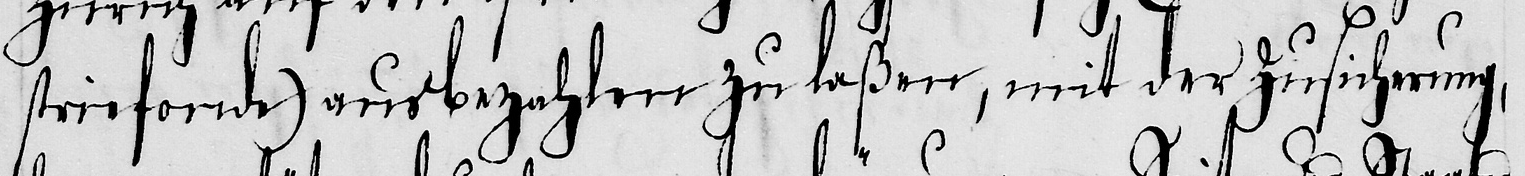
striefonde) ausbezahlen zu laßen, mit der Zusicherung,
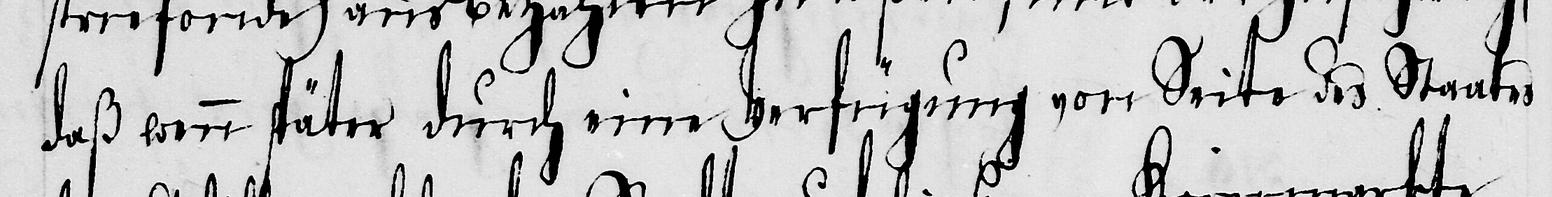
daß wenn später durch eine Verfügung von Seite des Staates
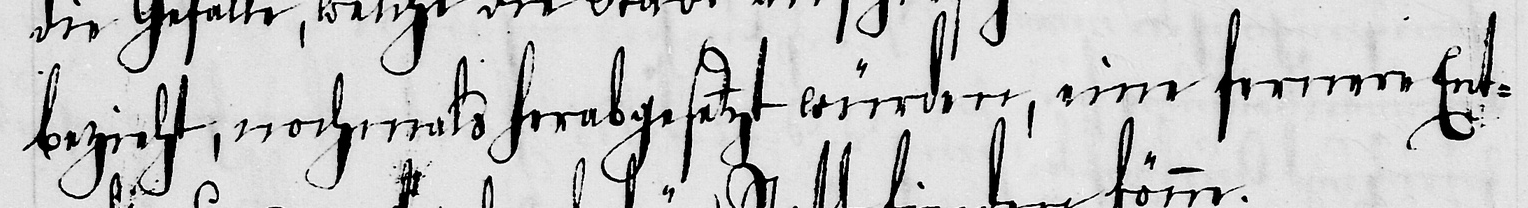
bezieht, nochmals herabgesetzt würden, eine fernere Ent¬
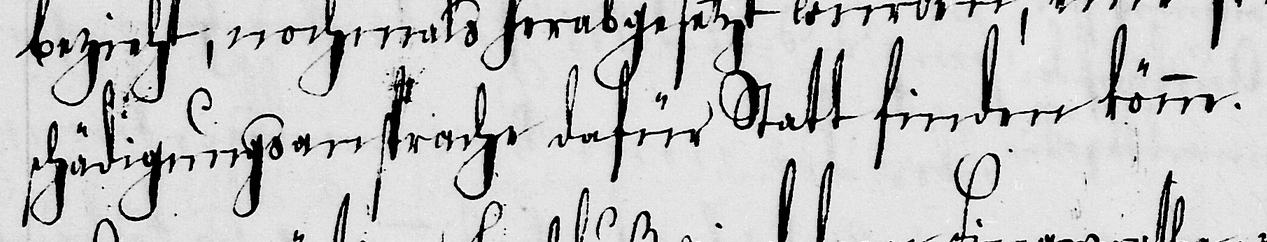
schädigungsansprache dafür Statt finden könne.
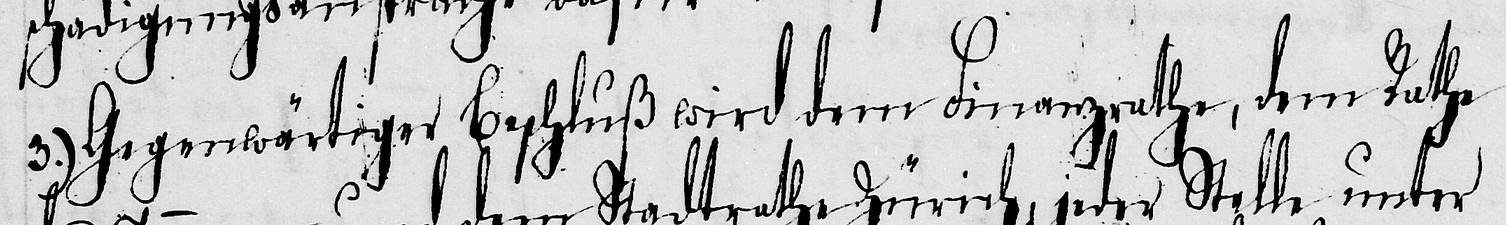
3.) Gegenwärtiger Beschluß wird dem Finanzrathe, dem Rathe
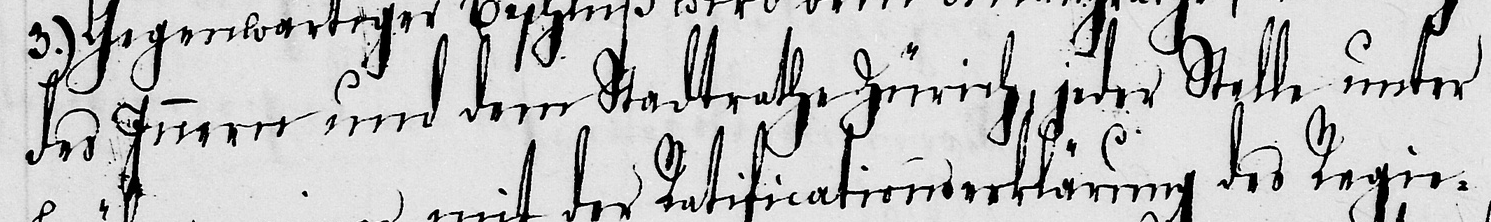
des Innern und dem Stadtrathe Zürich, jeder Stelle unter
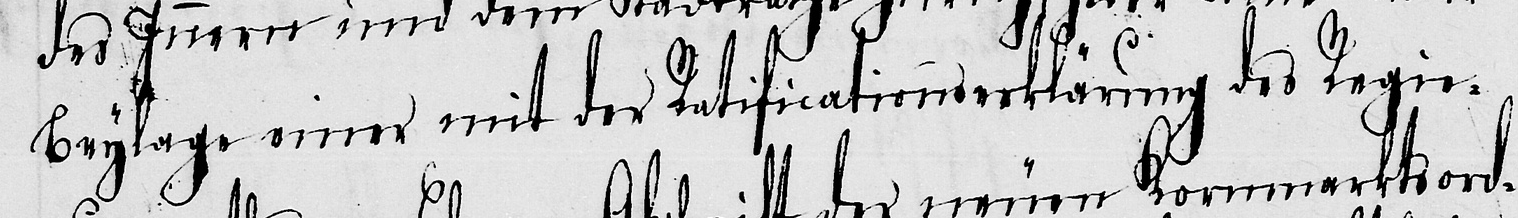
Beylage einer mit der Ratificationserklärung des Regie¬
